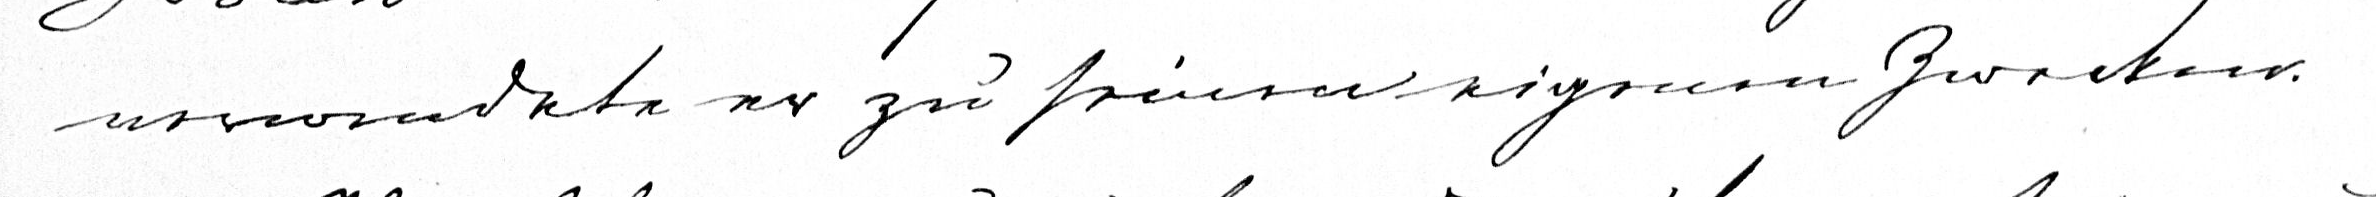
verwendete er zu seinen eigenen Zwecken.
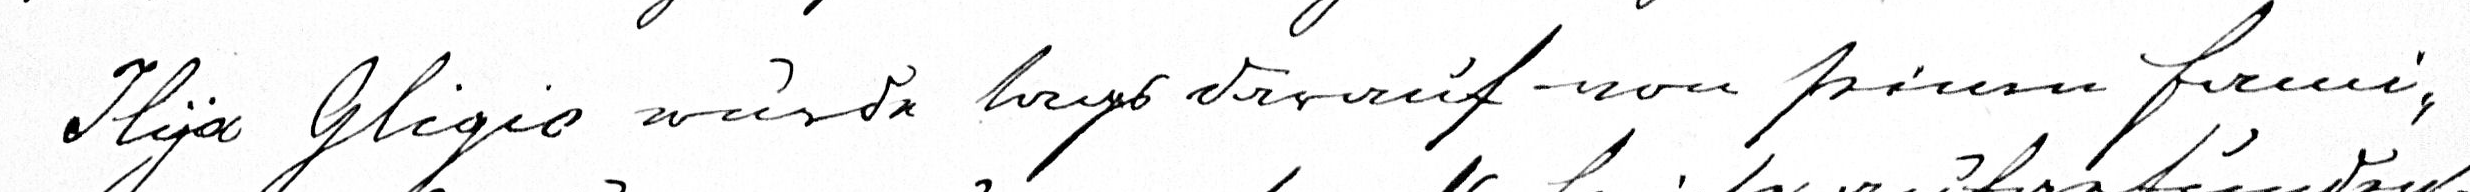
Ilija Gligic wurde tags darauf von seinen Fami¬
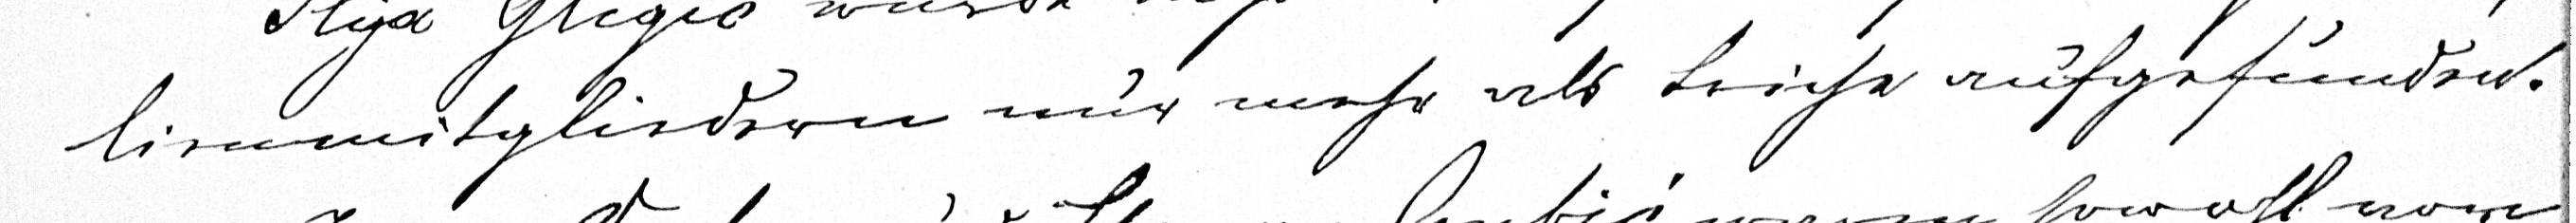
lienmitgliedern nur mehr als Leiche aufgefunden.
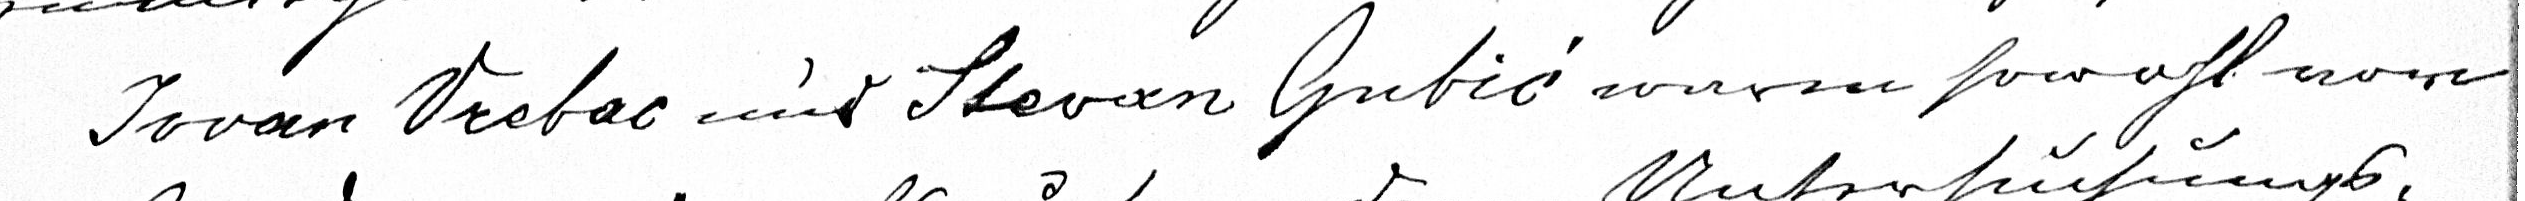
Jovan Vrebac und Stevan Gubić waren sowohl vor
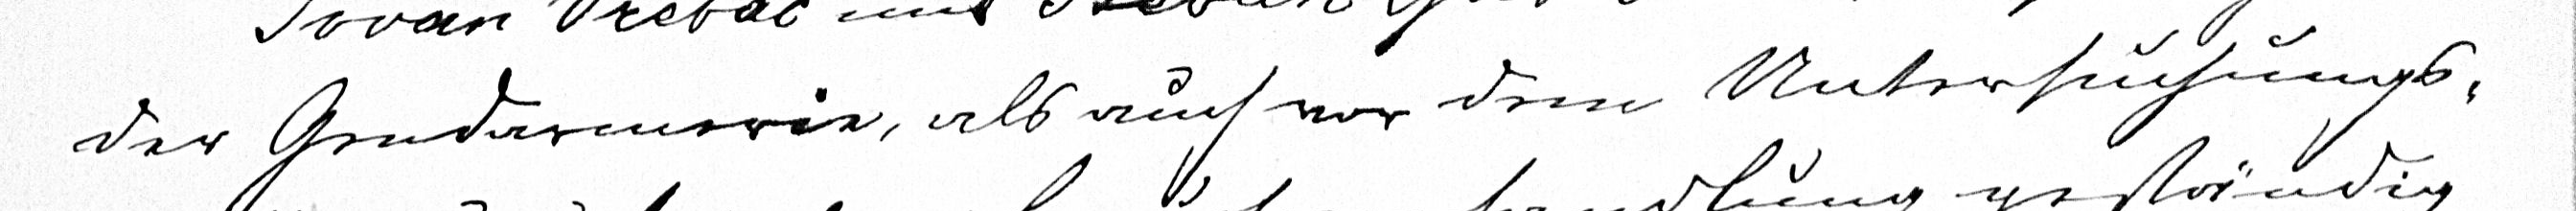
der Gendarmerie, als auch vor dem Untersuchungs¬
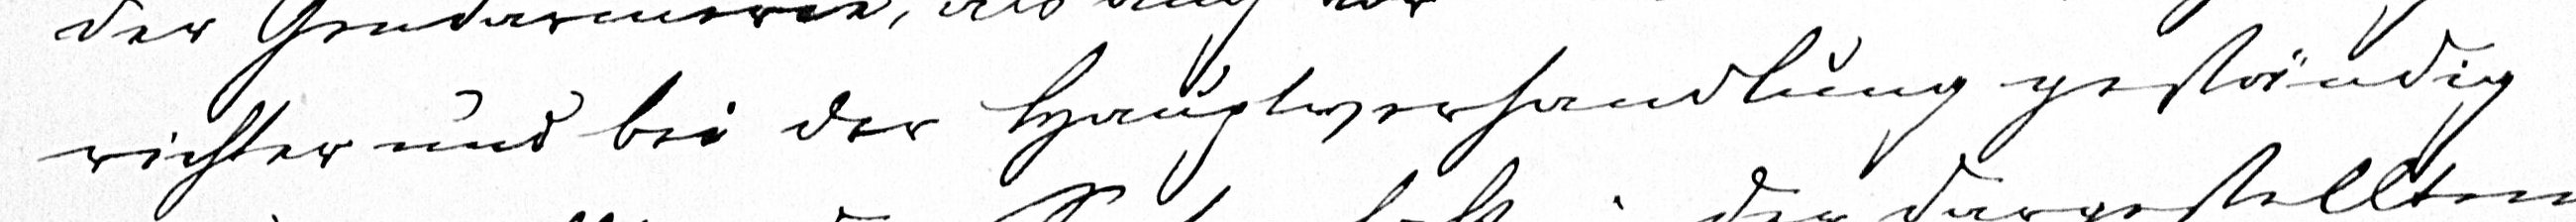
richter und bei der Hauptverhandlung geständig
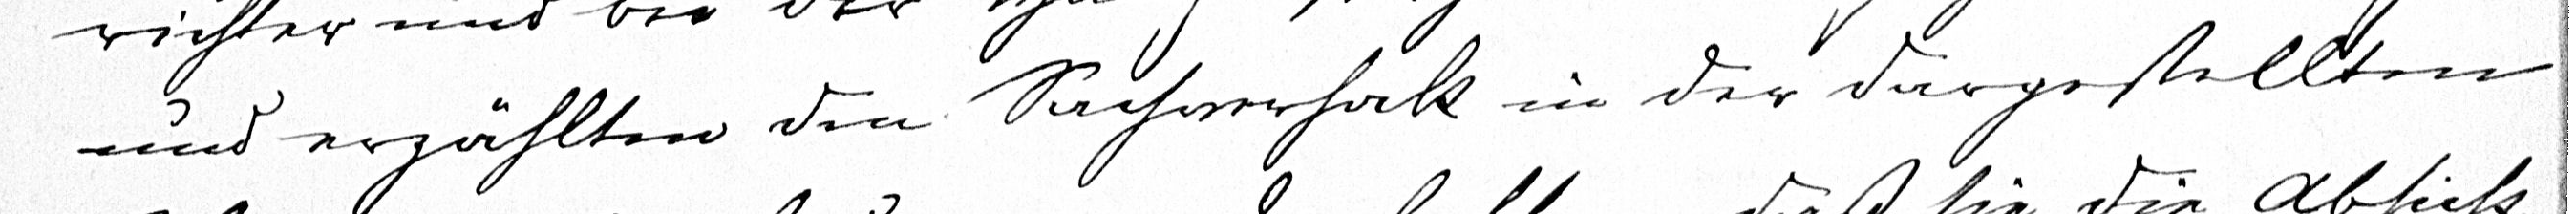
und erzählten den Sachverhalt in der dargestellten
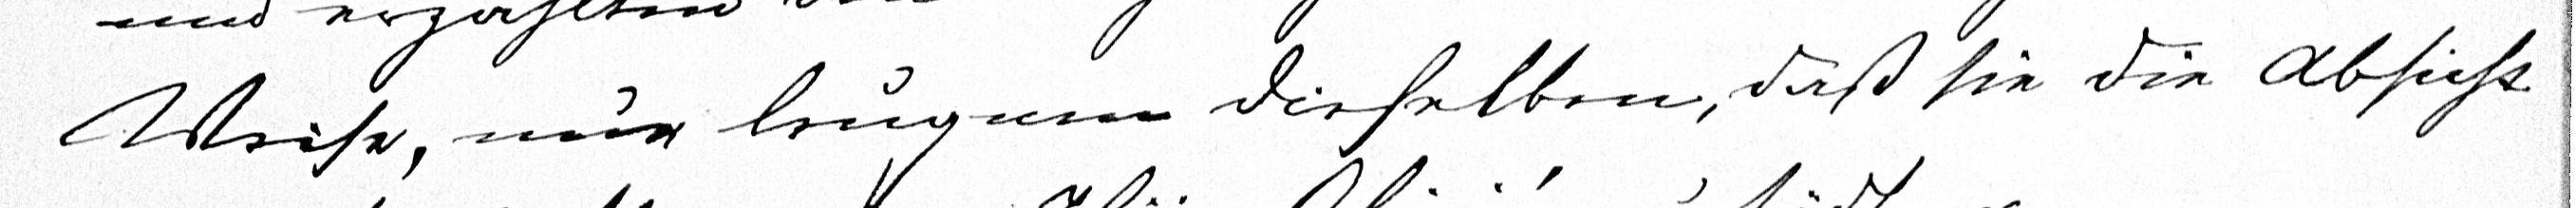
Weise, nur leugnen dieselben, daß sie Absicht
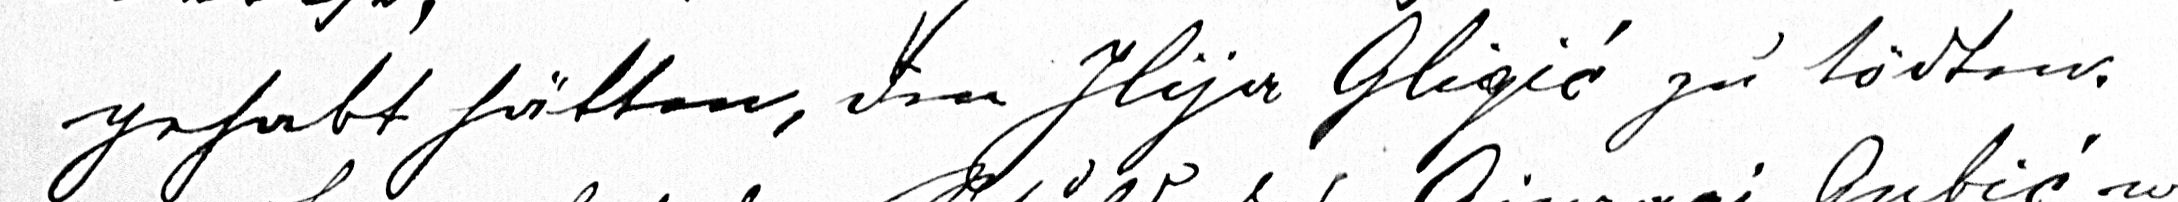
gehabt hätten, den Ilija Gligić zu tödten.
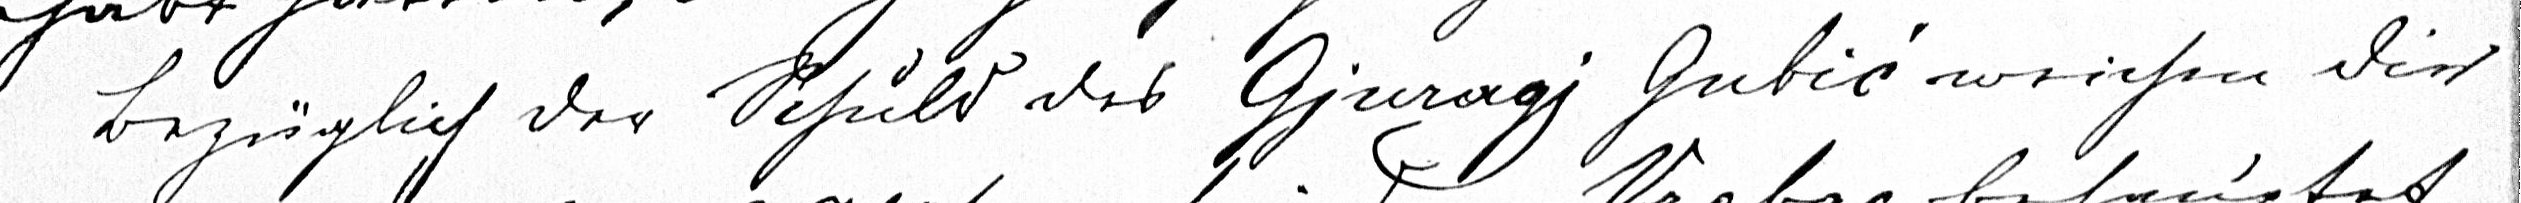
Bezüglich der Schuld des Gjuragj Gubić weichen die
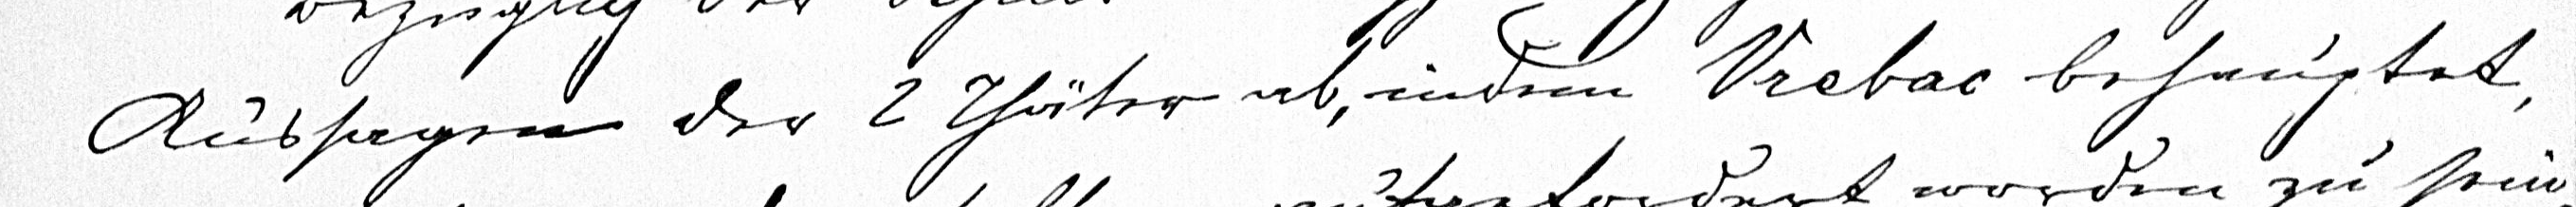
Aussagen der 2 Thäter ab, indem Vrebac behauptet,
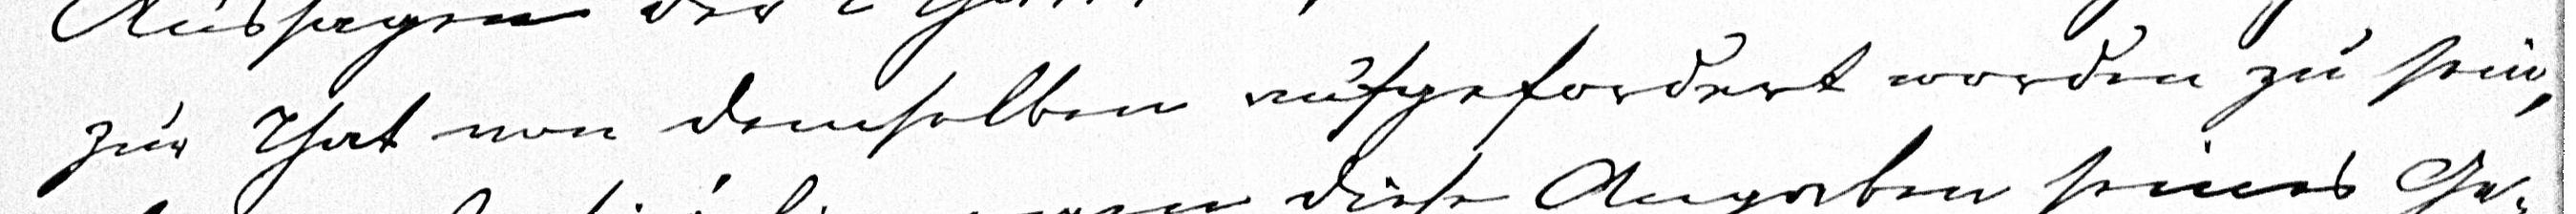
zur That von demselben aufgefordert worden zu sein,
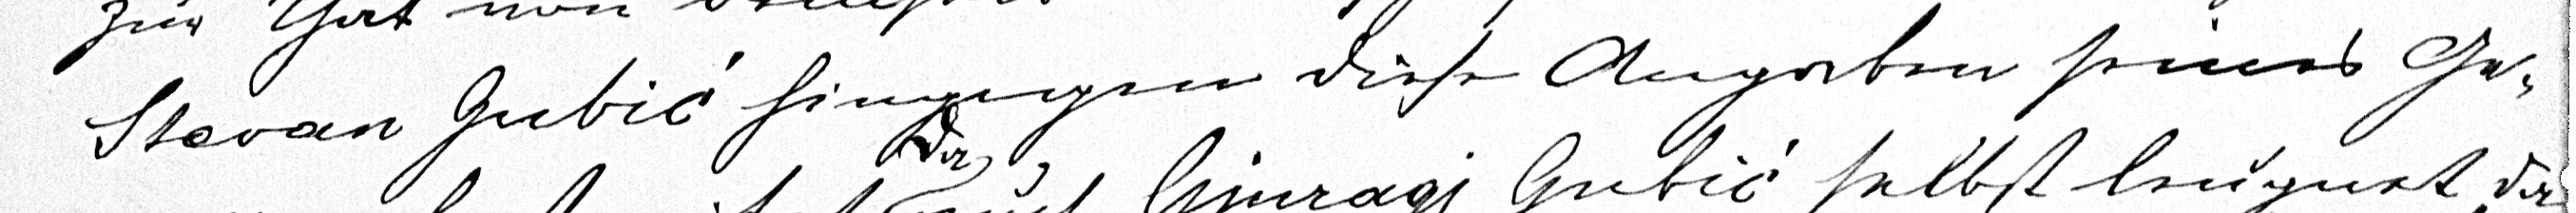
Stevan Gubić hingegen diese Angaben seines Ge¬
